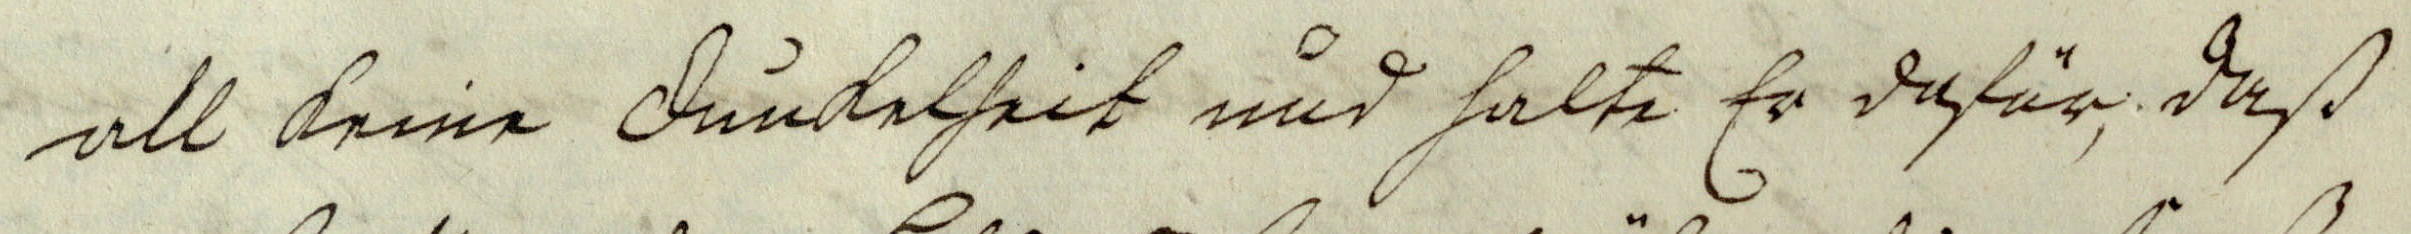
all keine Dunkelheit und halte Er dafür, daß
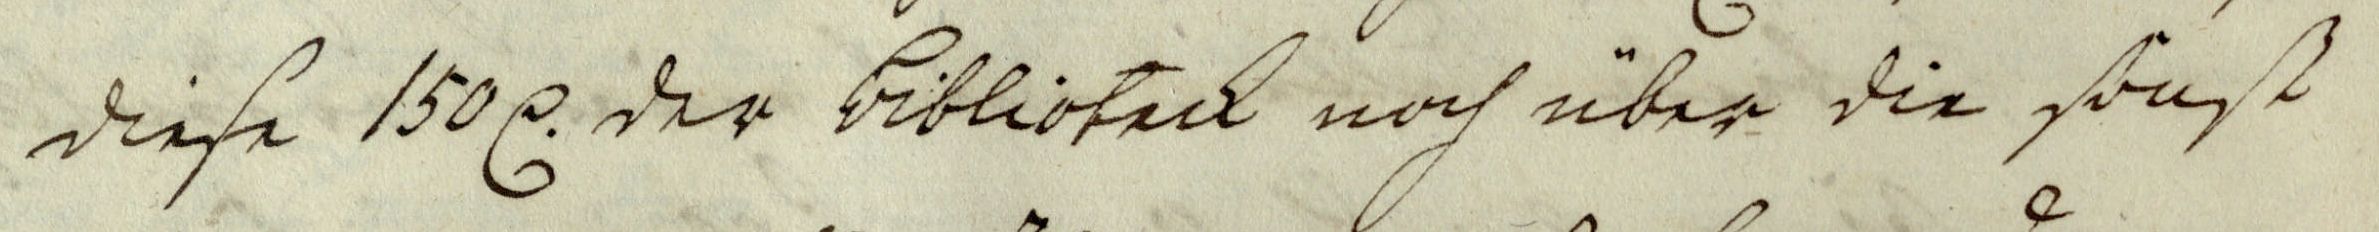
diese 150 rtl. der Bibliotek noch über die sonst
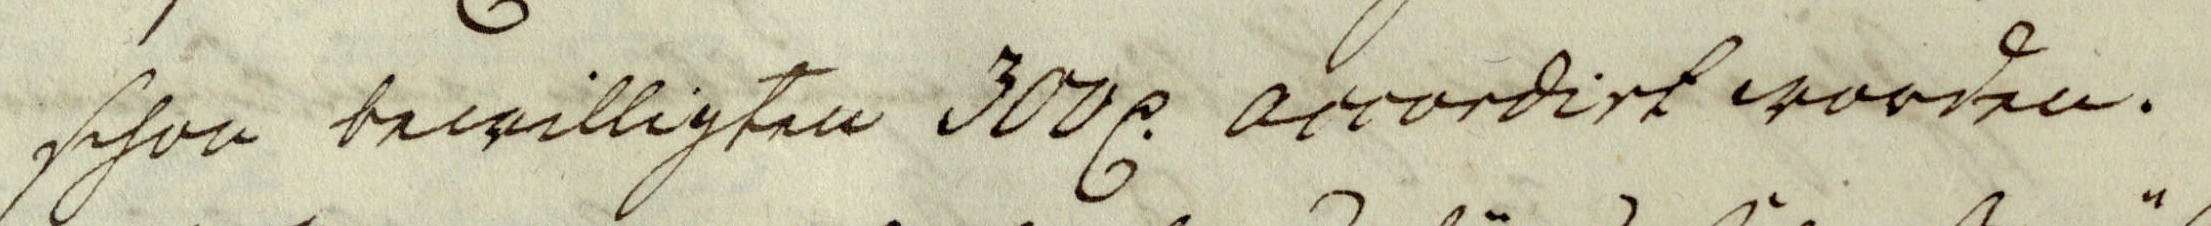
schon bewilligten 300 rtl. accordirt worden.
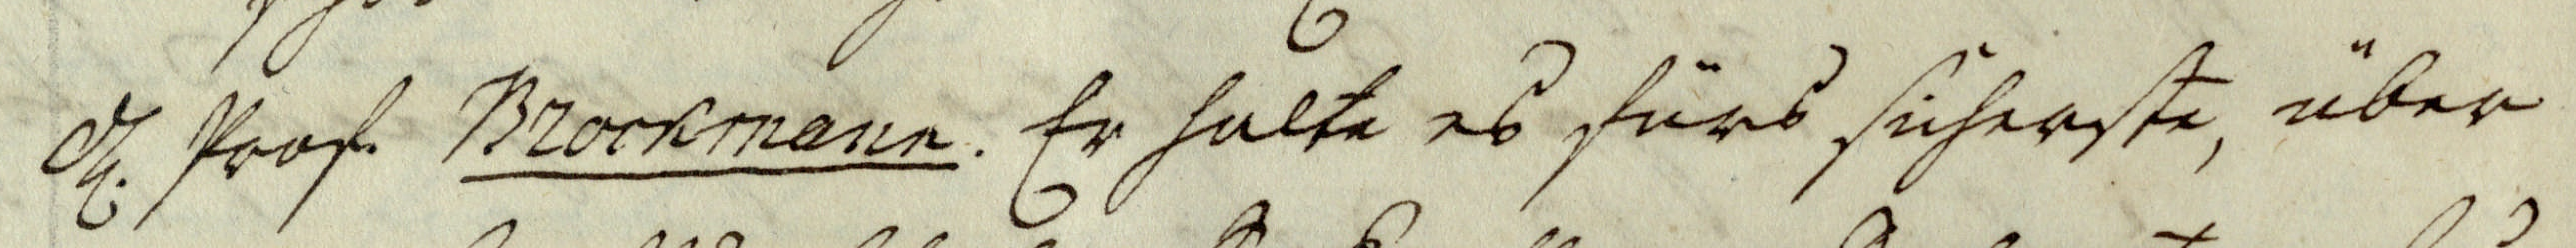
dh. Prof. Brockmann. Er halte es fürs sicherste, über
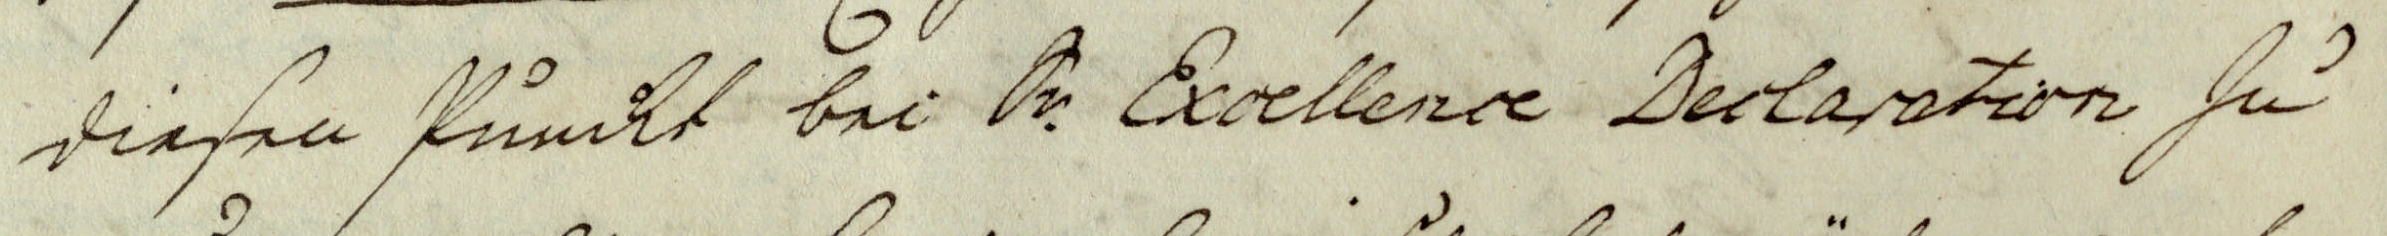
diesen Punkt bei Sr. Excellence Declaration zu
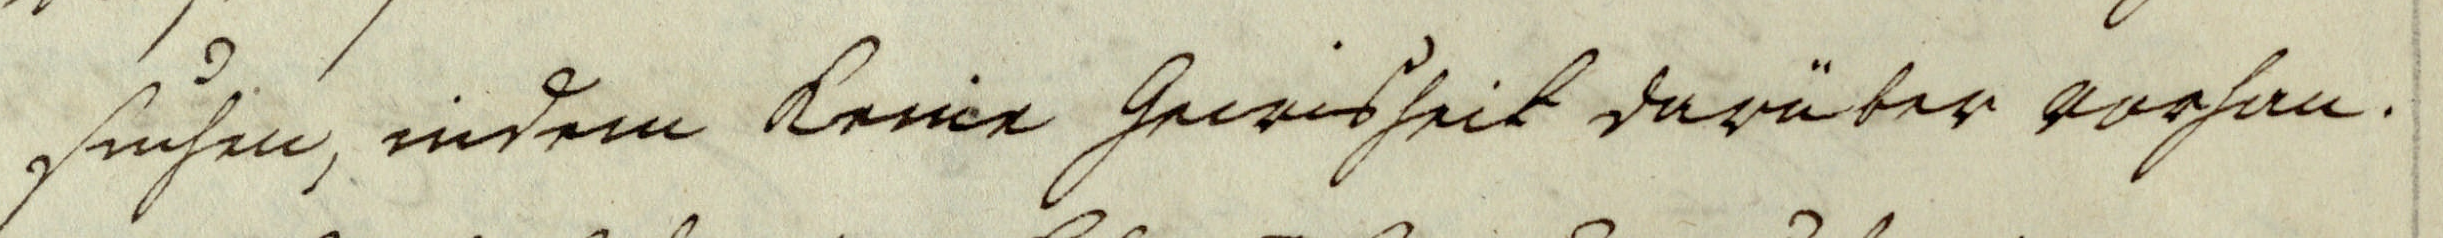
suchen, indem keine Gewisheit darüber vorhan¬
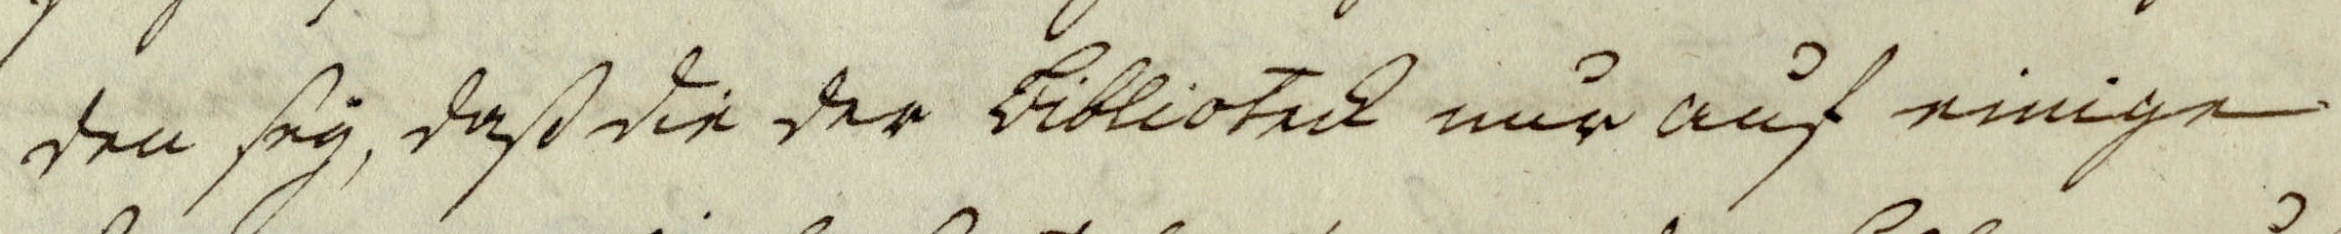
den seÿ, daß die der Bibliotek nur auf einige
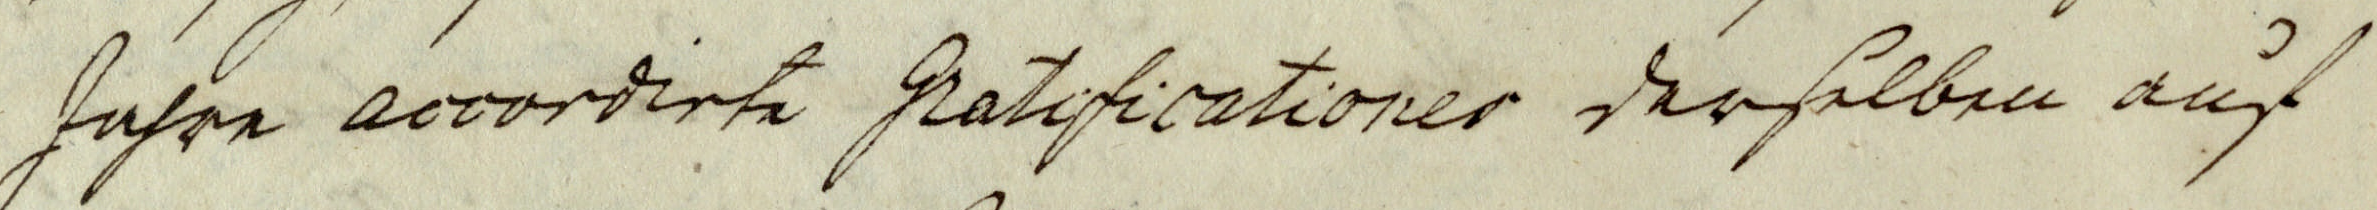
Jahre accordirte Gratificationes derselben auf
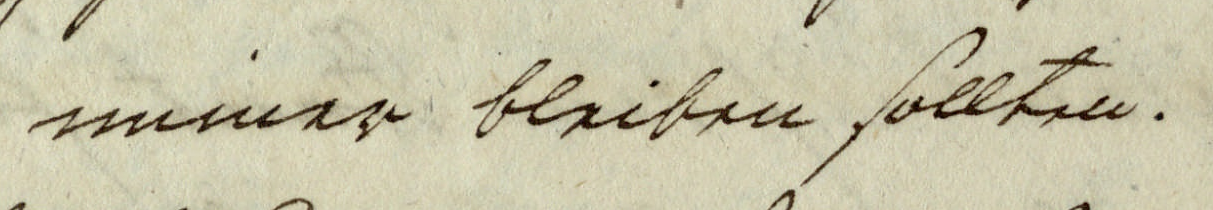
immer bleiben sollten.
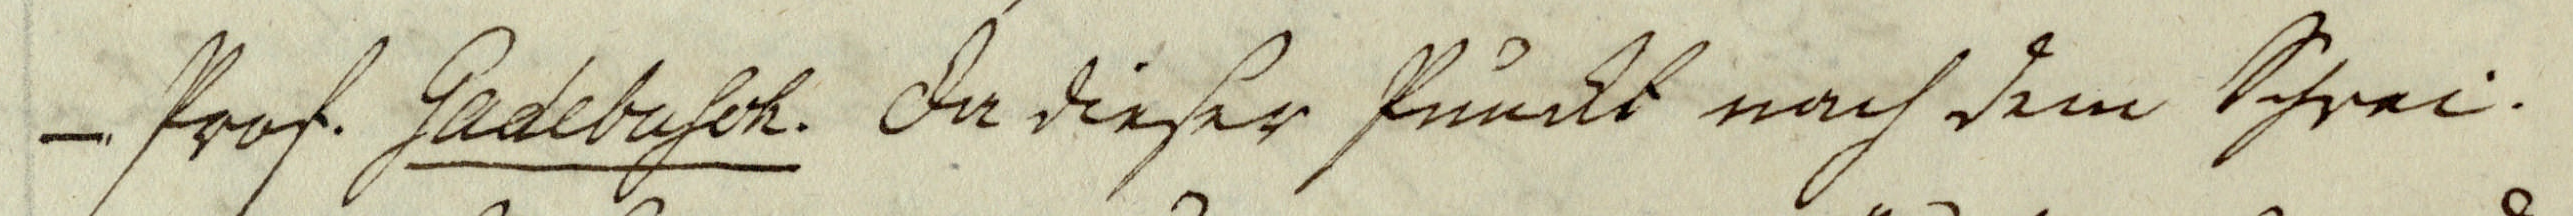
— . Prof. Gadebusch. Da dieser Punkt nach dem Schrei¬
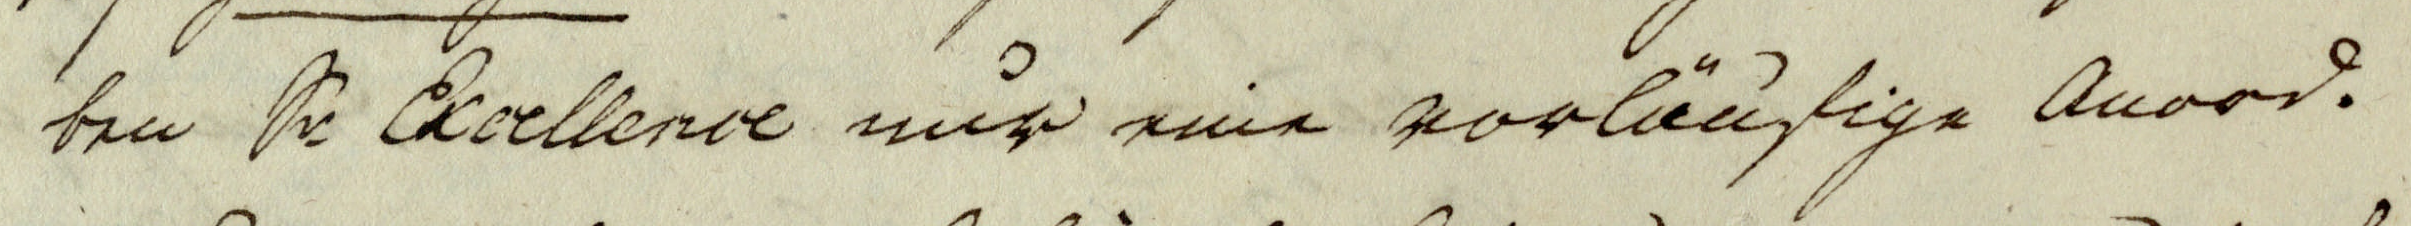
ben Sr. Excellence nur eine vorläufige Anord¬
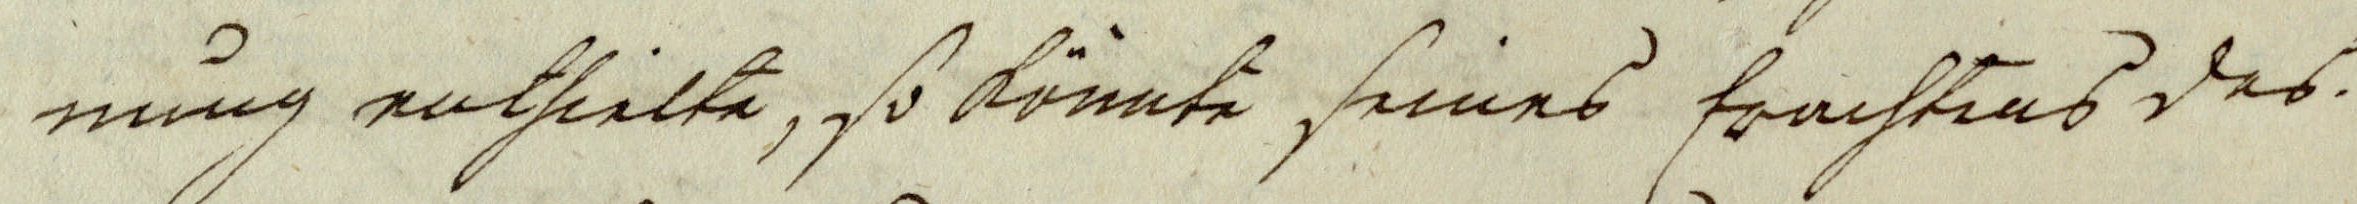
nung enthielte, so könnte seines Erachtens des¬
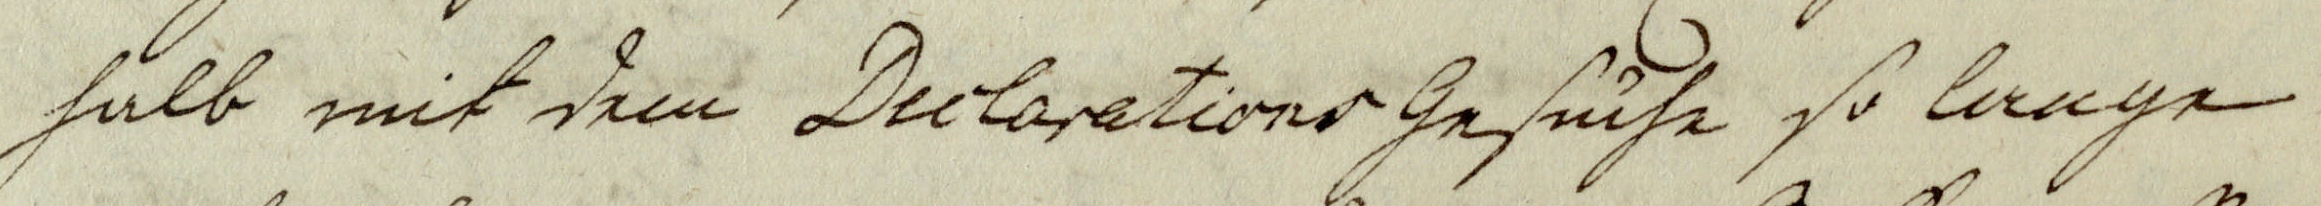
halb mit dem Declarations Gesuche so lange
